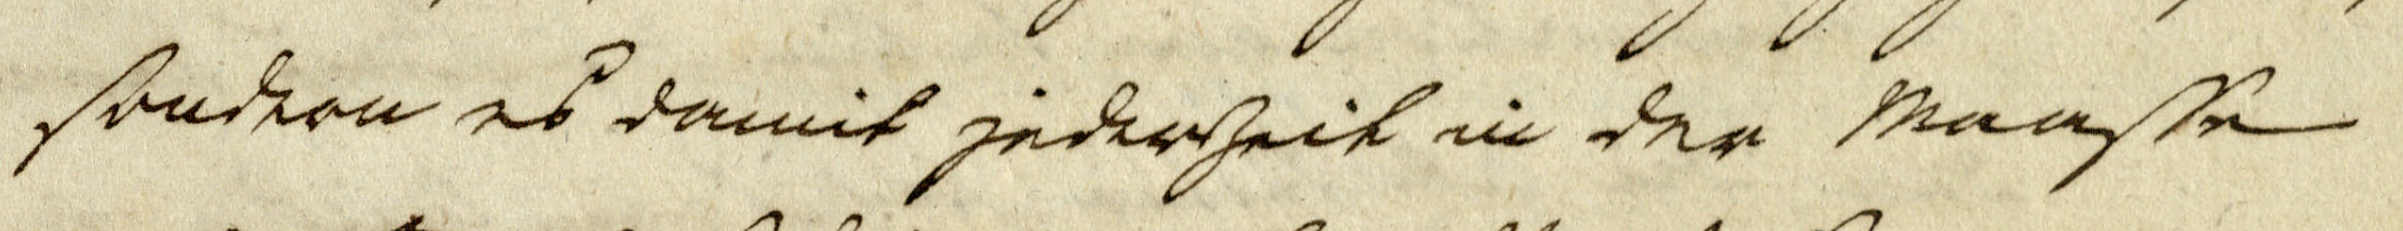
sondern es damit jederzeit in der Maasse
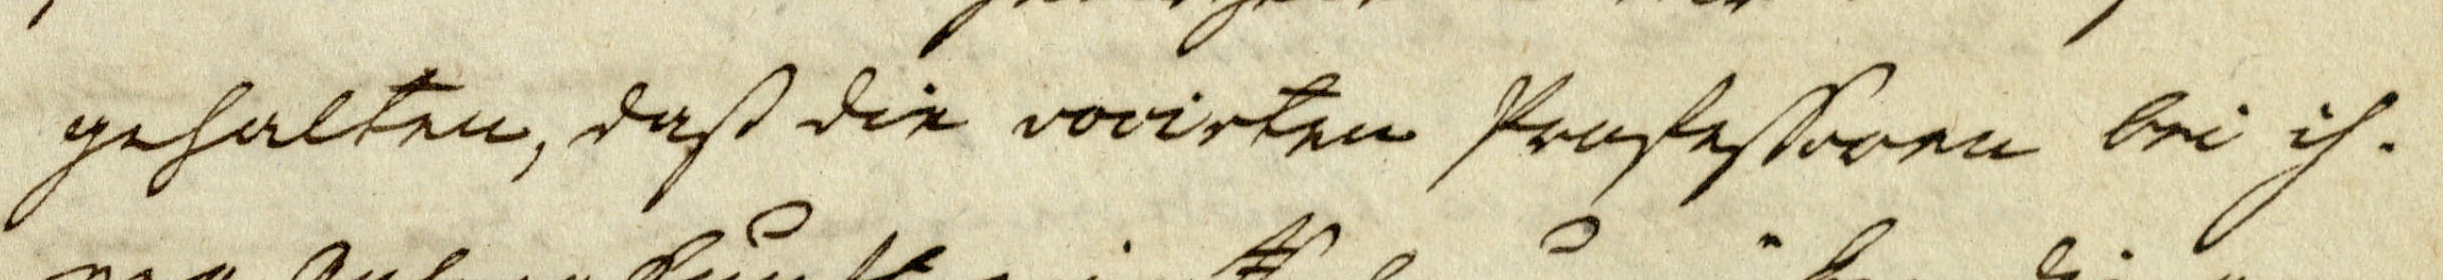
gehalten, daß die vocirten Professoren bei ih¬
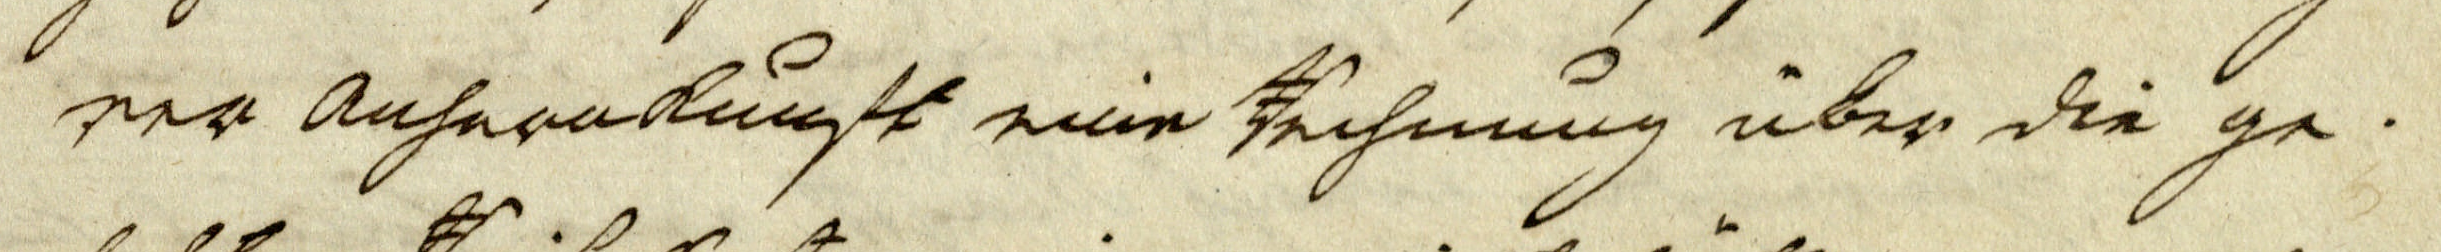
rer Anherokunft eine Rechnung über die ge¬
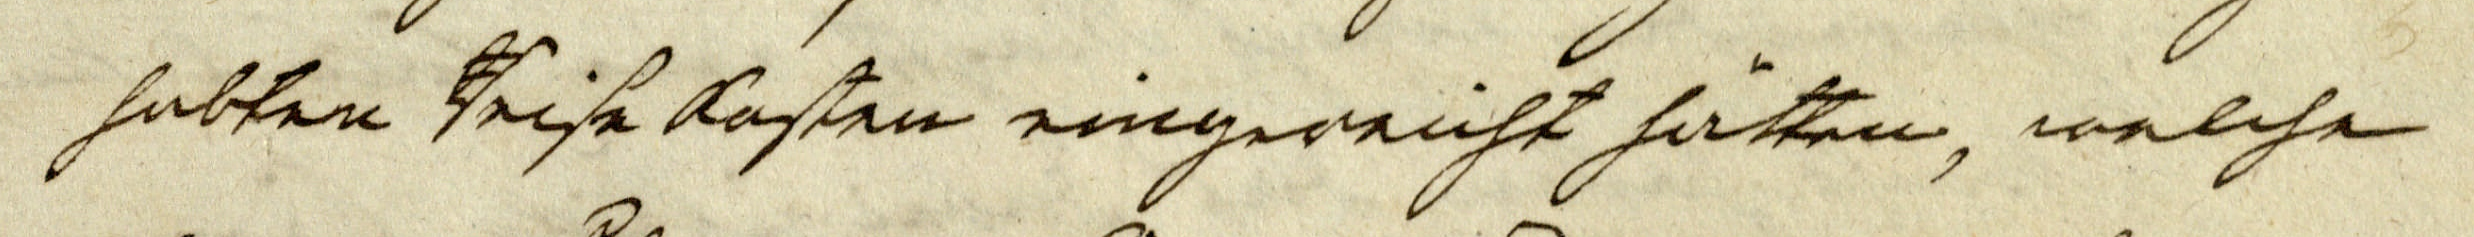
habten Reise Kosten eingereicht hätten, welche
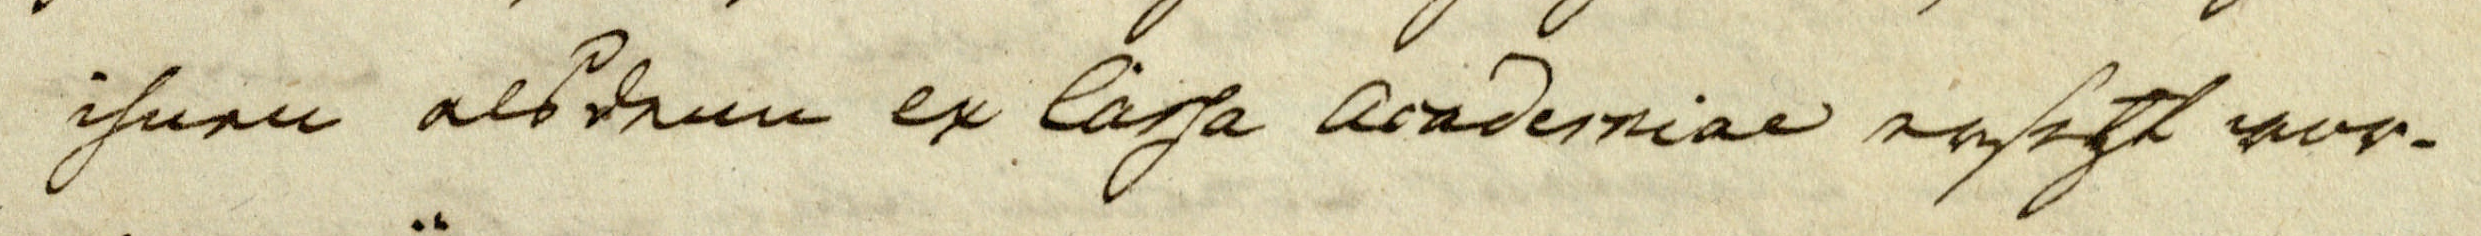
ihnen als denn ex Cassa Academiae ersetzt wor¬
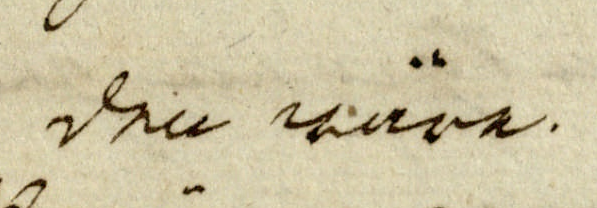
den wäre.
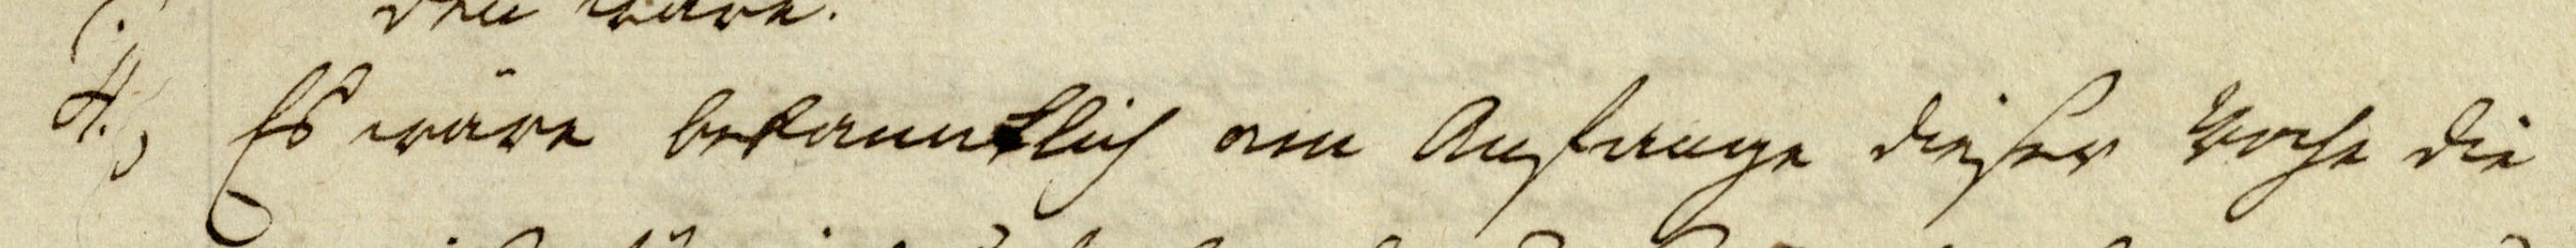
4., Es wäre bekanntlich am Anfange dieser Woche die
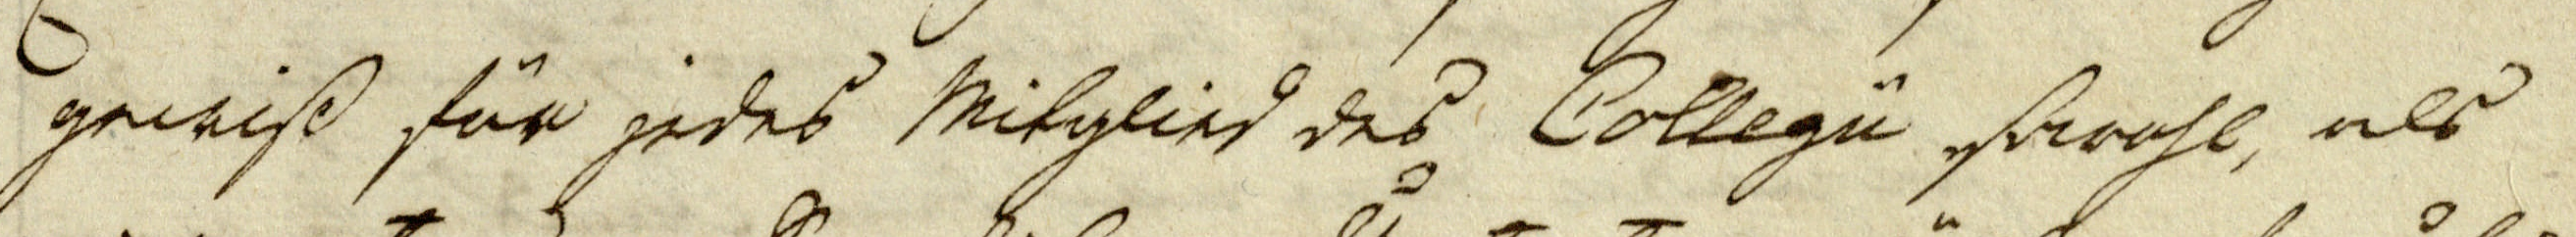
gewiß für jedes Mitglied des Collegii sowohl, als
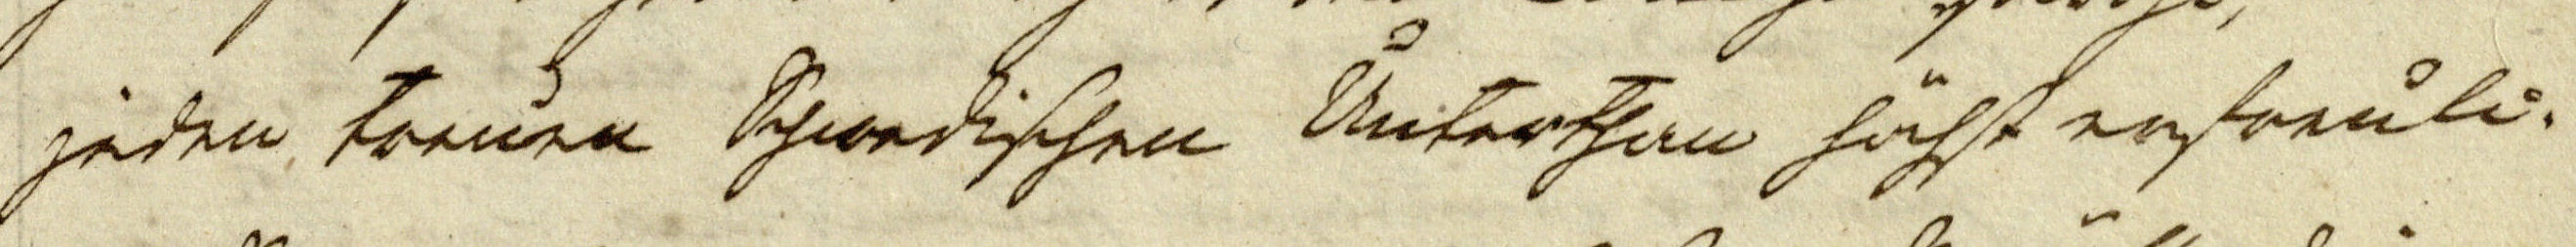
jeden treuen Schwedischen Unterthan höchst erfreuli¬
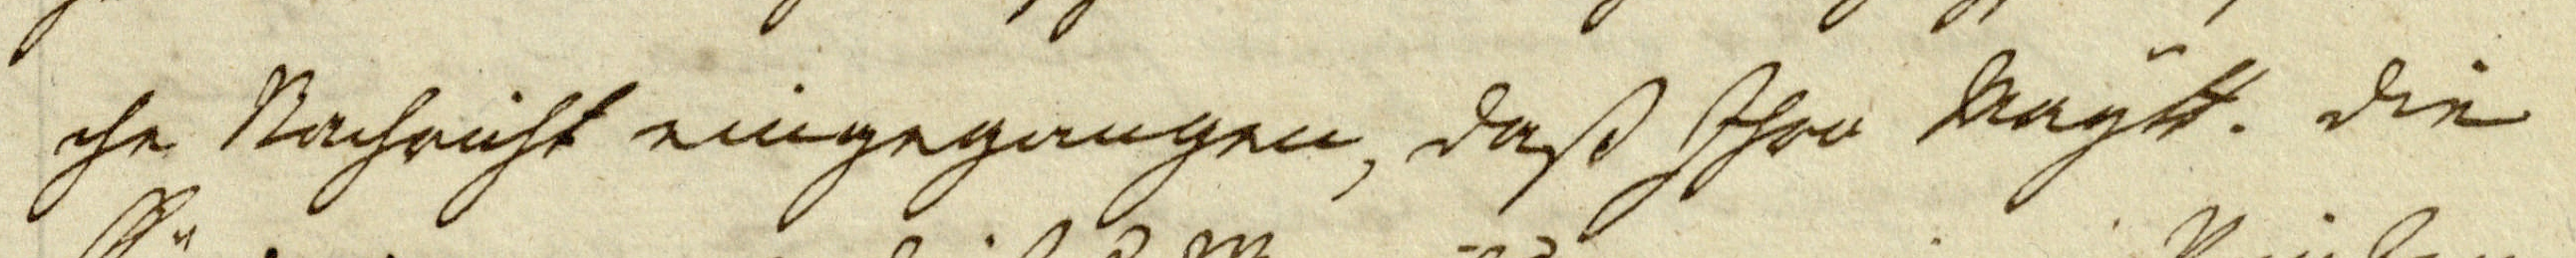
che Nachricht eingegangen, daß Ihro Maÿtt. die
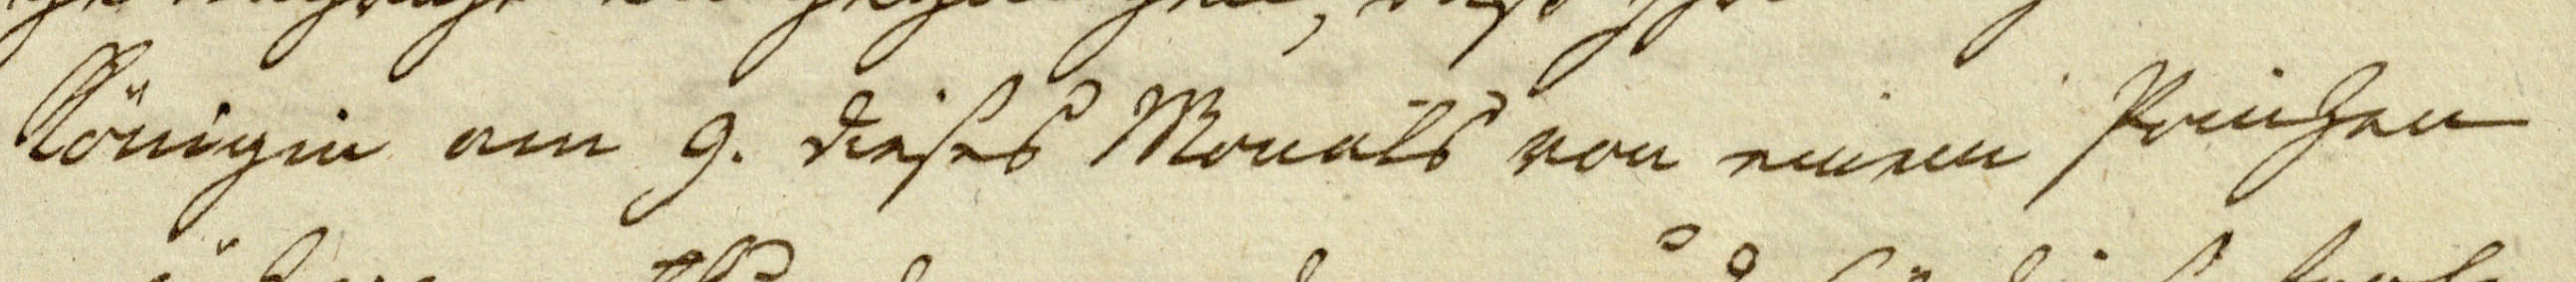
Königin am 9. dieses Monats von einem Prinzen
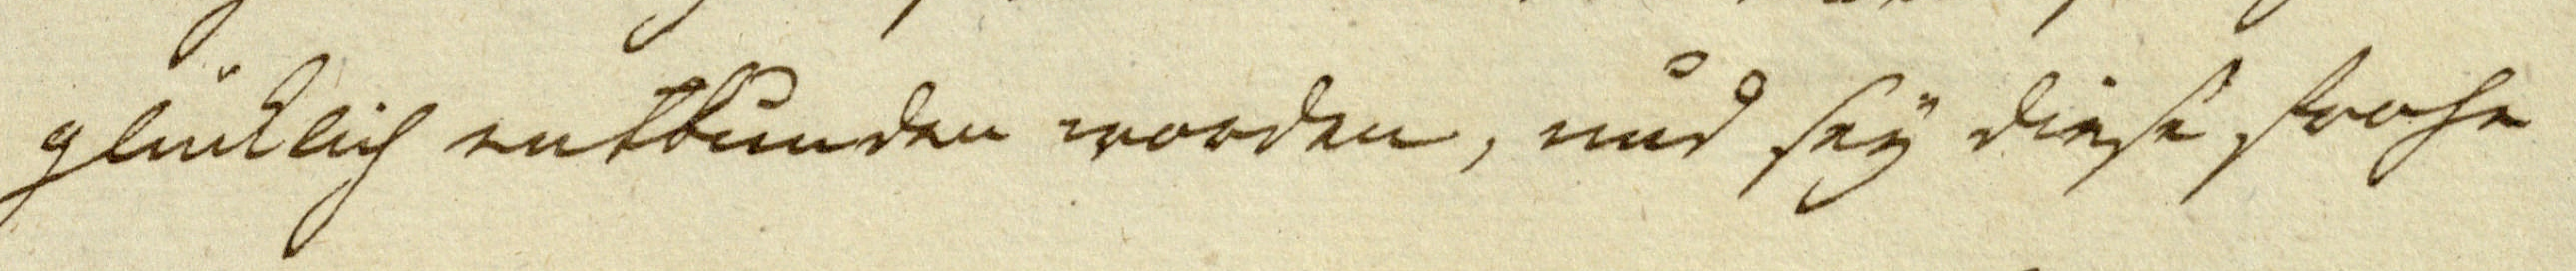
glücklich entbunden worden, und seÿ diese frohe
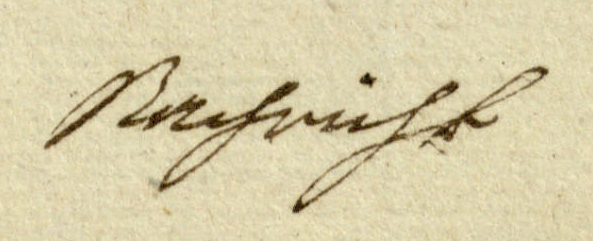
Nachricht
